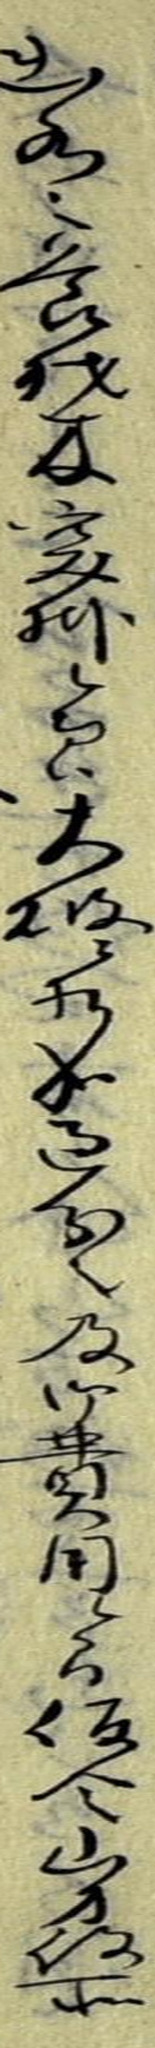出水之節材木突掛候而は大破に相成過分之及御費用候間仮令山方役所
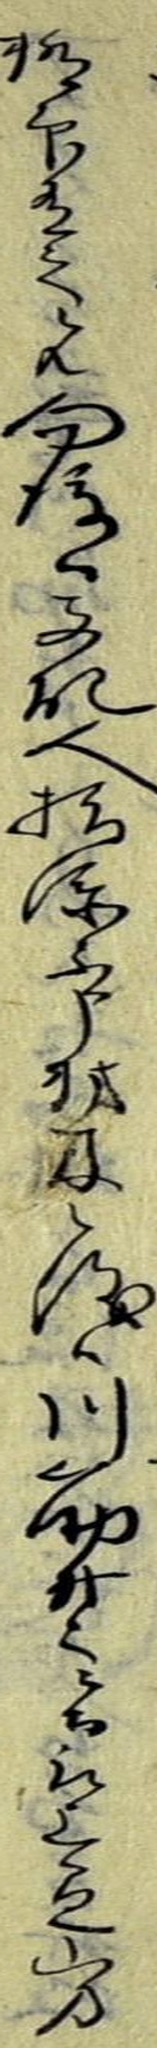極印有之候共向後は支配人指添不申材木之儀は川筋村々に而取上置山方
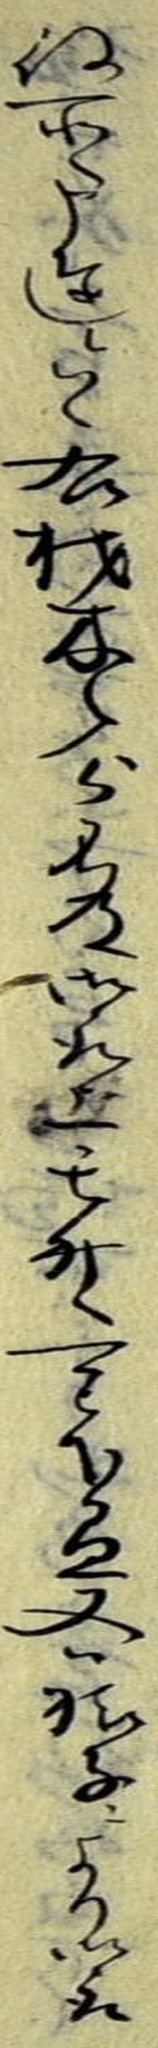役所へ申達候はヽ右材木之分不及御取上其村へ可被下置又は様子により御取

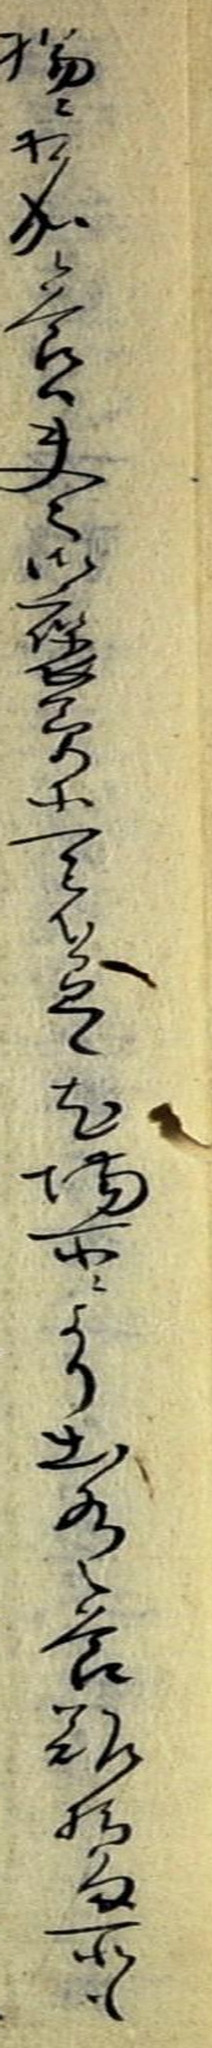揚に相成候節は夫々御褒美等可被下置候尤場所により出水之節難指留所も
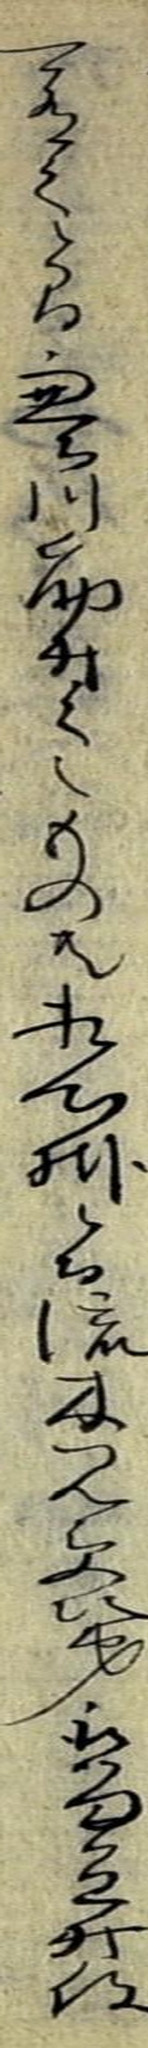可有之候間兼而川筋村々之もの共相心掛候而流木見受次第取留置村役
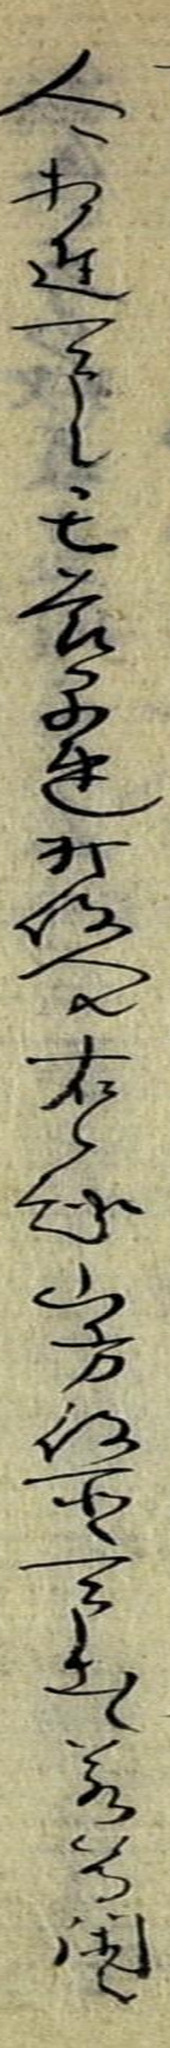人へ相達可申候其節早速村役人共右之趣山方役所へ可被申出候若等閑之
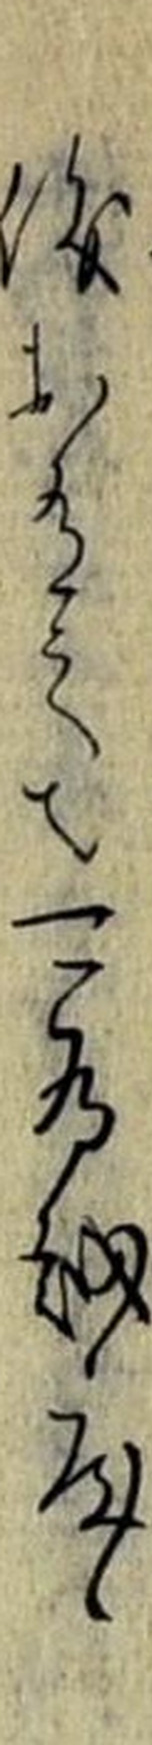儀於有之は可為越度候
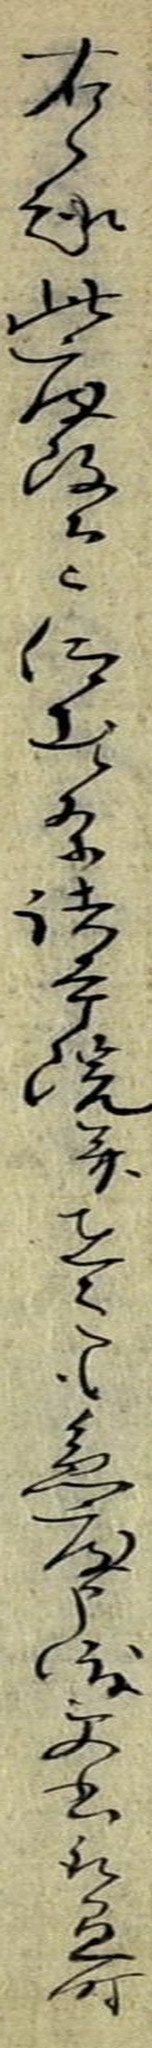右之趣此度改而被仰出候条諸寺院并在々へも急度申渡受書取置時
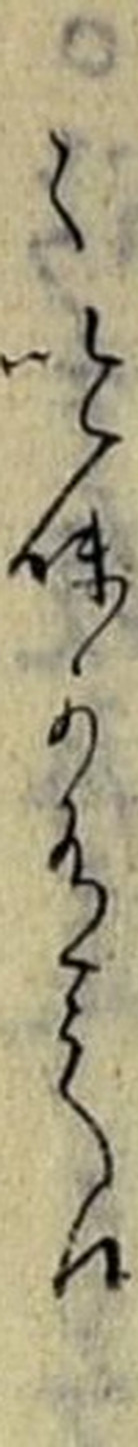々吟味可有之候
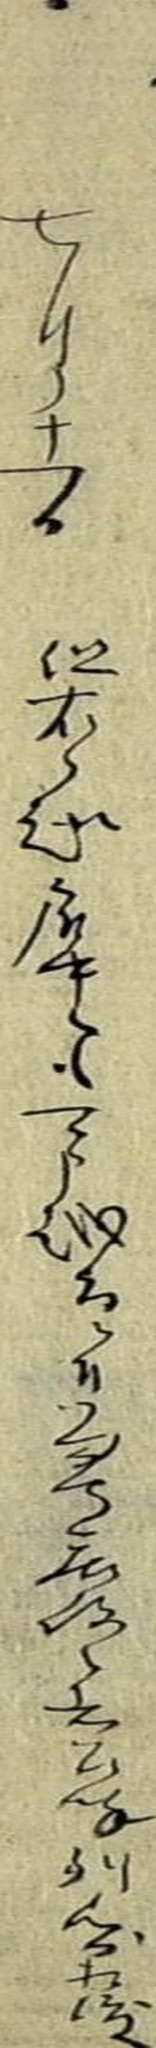七月十一日但右之趣府中へも可申越旨に付御留守居役之者召呼別紙相渡
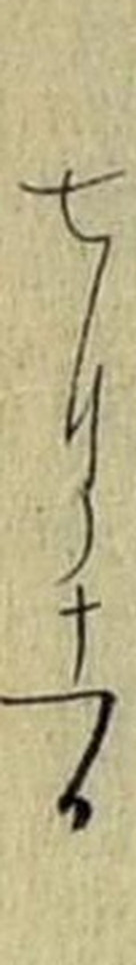七月十一日
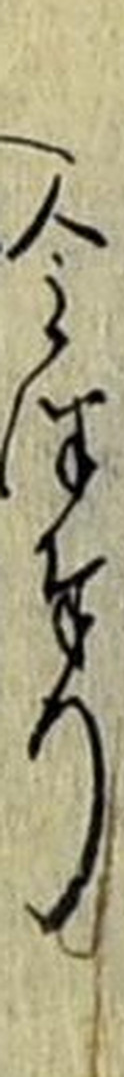金津奉行
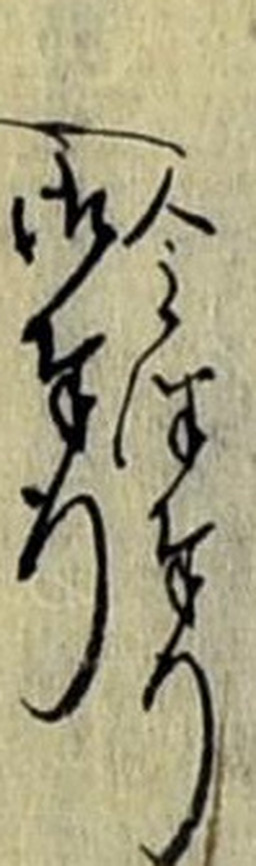御奉行
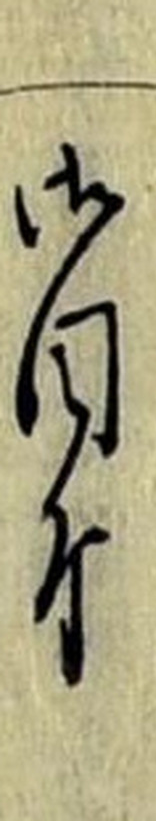御目付
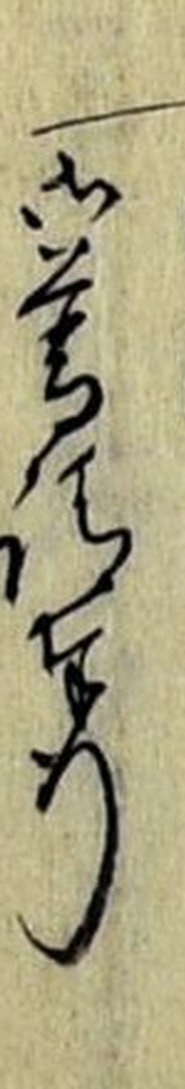御普請奉行
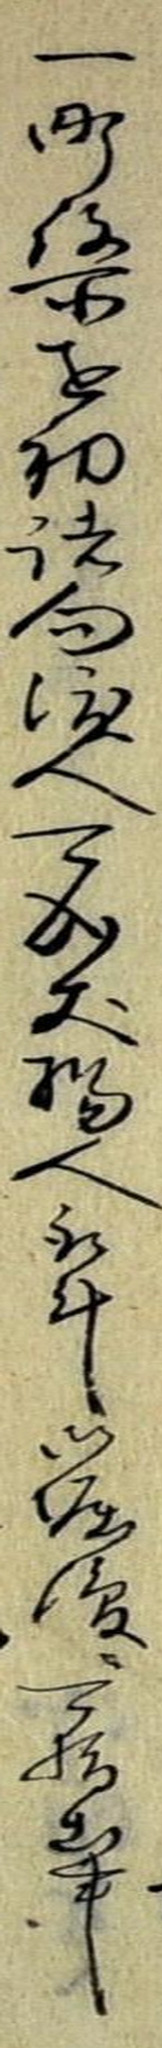一町役所を初諸向渡人可成丈揚人取斗御堀浚に可指出事
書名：命令之部 四
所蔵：福井県文書館 Fukui Prefectural Archives
